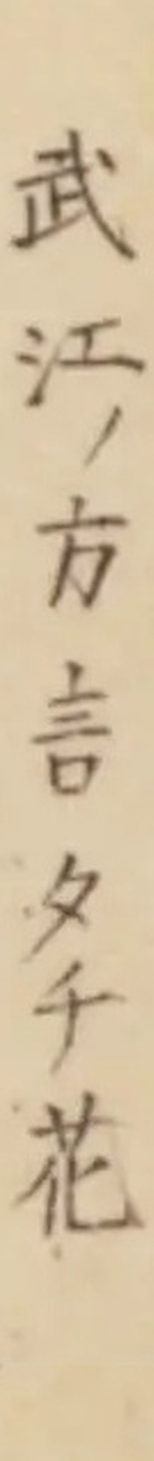武江ノ方言タチ花
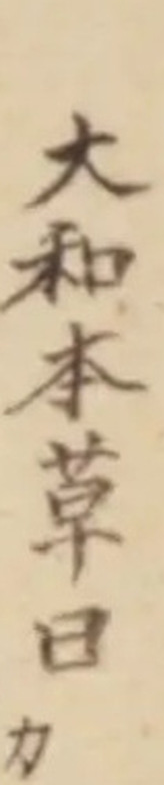大和本草曰
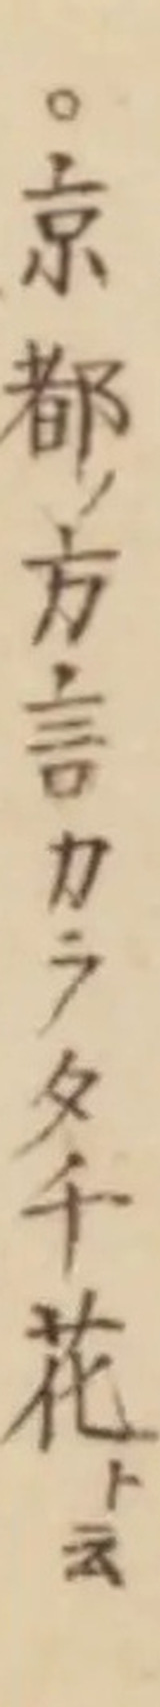〇京都ノ方言カラタチ花ト云
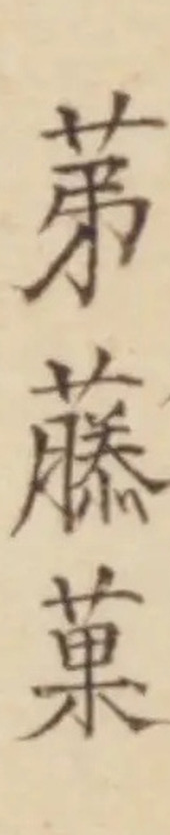苐藤菓
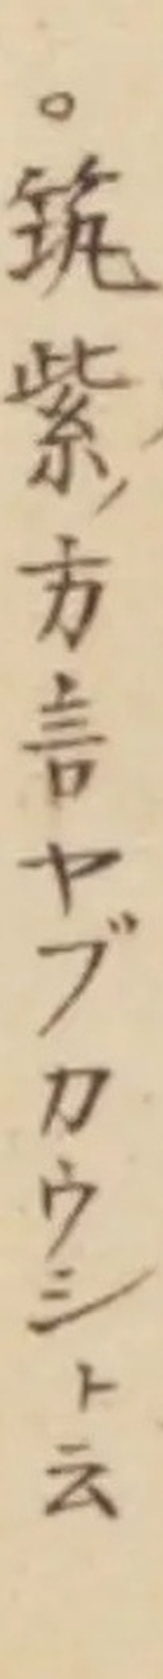〇筑紫ノ方言ヤブカラシト云
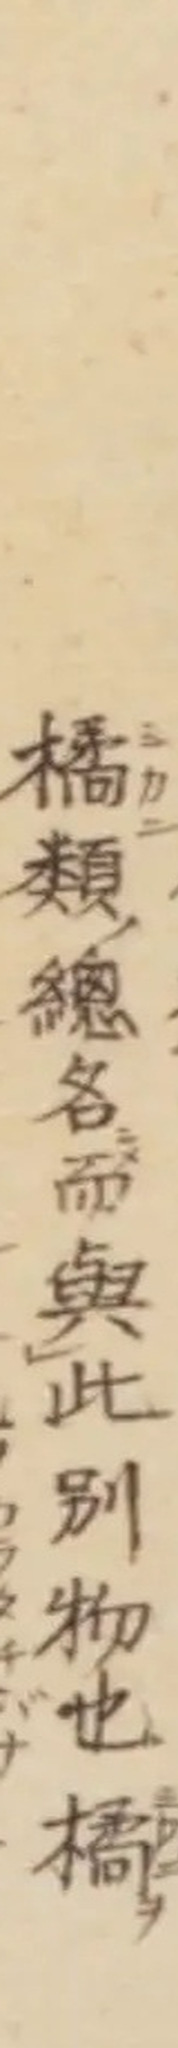橘類ノ總名ニシテ而與此別物也橘を
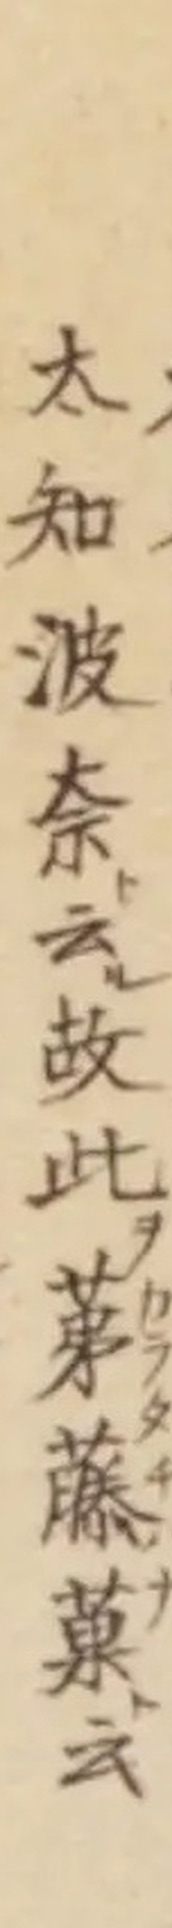太知波奈ト云ル故此ヲ茅藤菓ト云
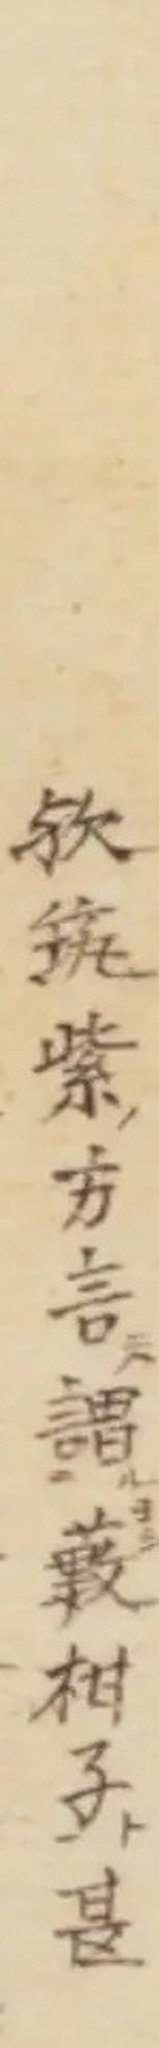欤筑紫ノ方言ニハ謂ル藪柑子ト甚
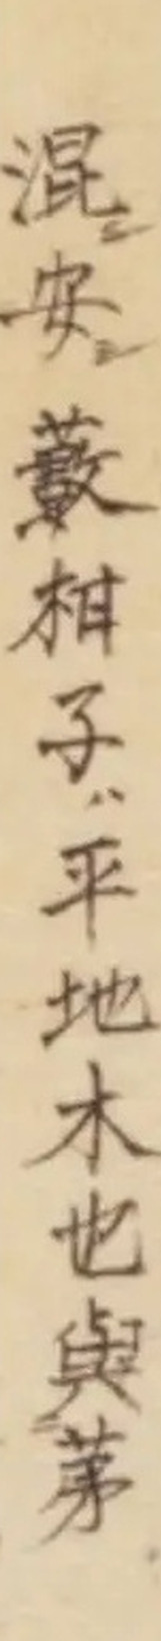混シ安シ藪柑子ハ平地木也與茅
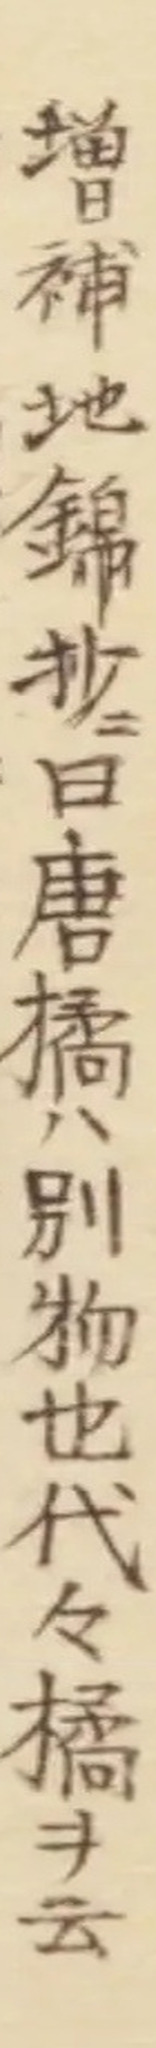増補地錦抄ニ曰唐橘ハ別物也代々橘ヲ云
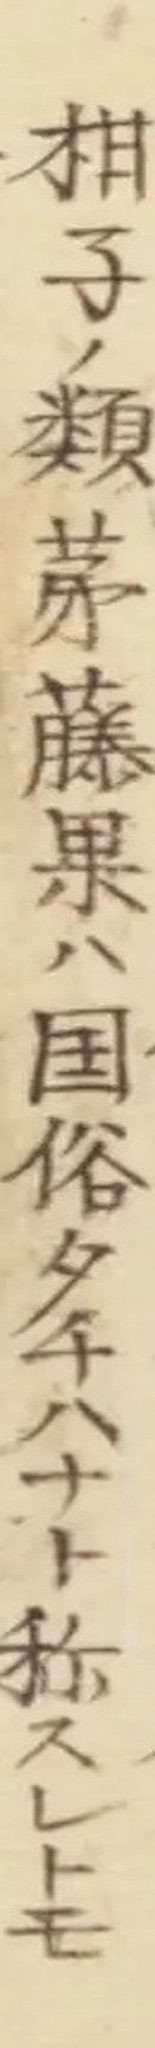柑子ノ類茅藤果ハ国俗タチハナト称スレトモ
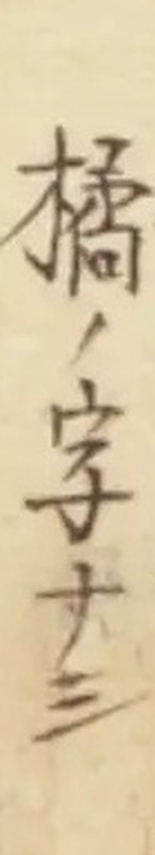橘ノ字ナシ
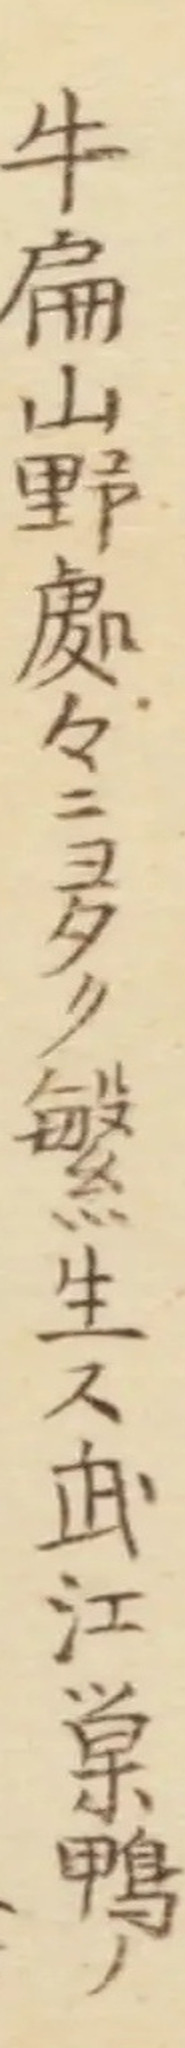牛扁山野処々ニ多ク繫生ス武江巣鴨ノ
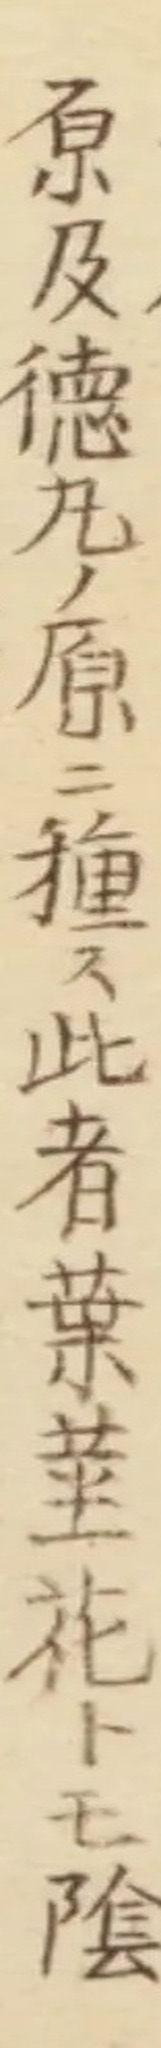原及ビ徳丸ノ原ニ種ス此者葉茎花トモ陰
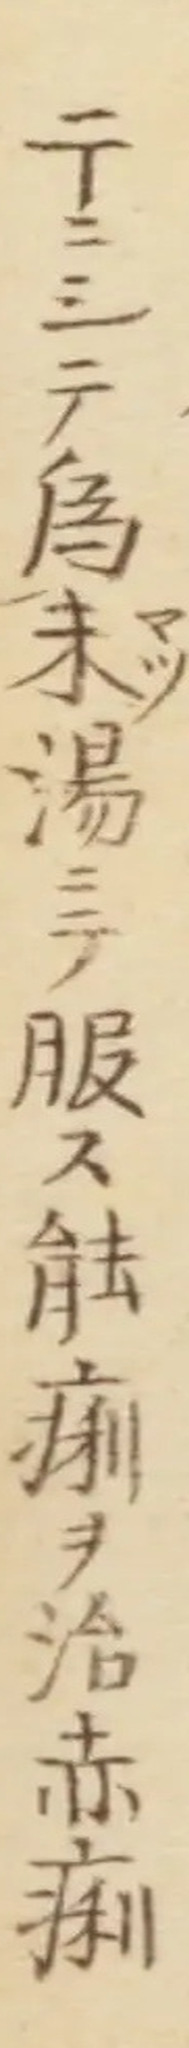干ニシテ為末湯ニテ服ス能痢ヲ治赤痢
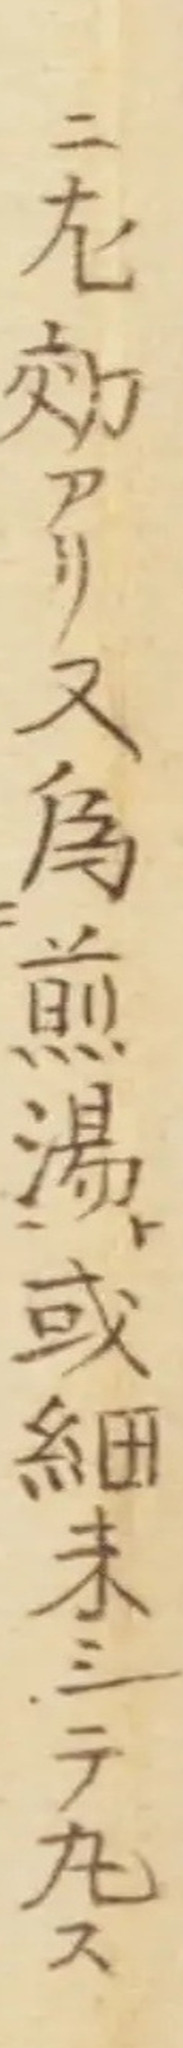ニ尤効アリ又爲煎湯ト或細末シテ丸ス
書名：梅園草木花譜夏之部. 4
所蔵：国立国会図書館 National Diet Library, JAPAN
